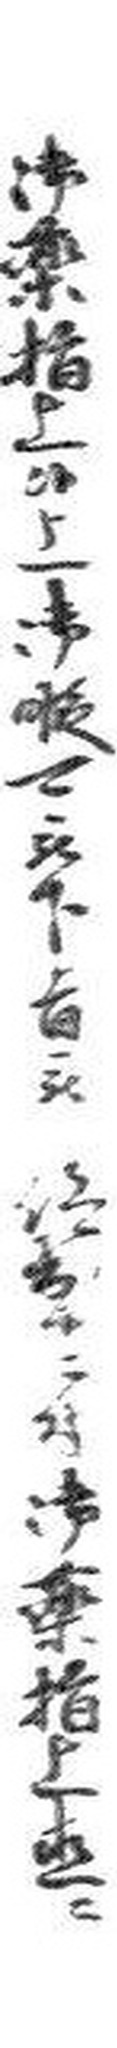御薬指上候上御暇可被下旨被仰出候ニ付御薬指上直ニ
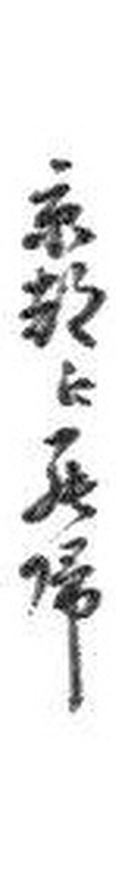京都江罷帰
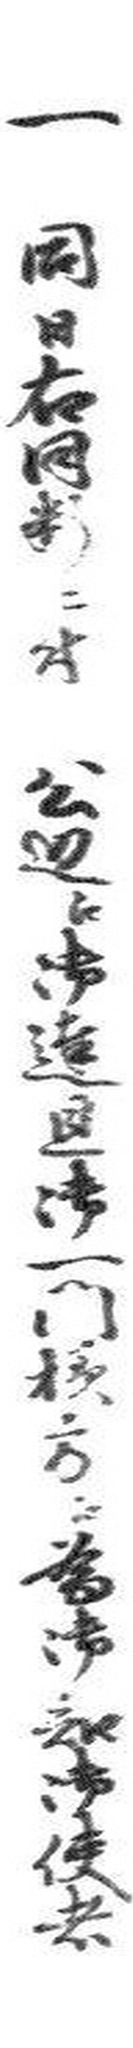一右同断ニ付公辺江御達且御一門様方江為御知御使者
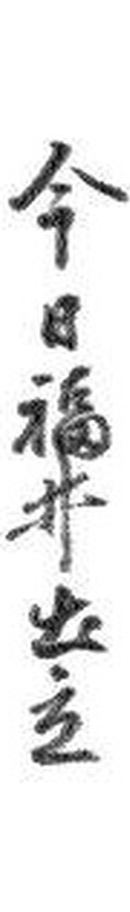今日福井出立
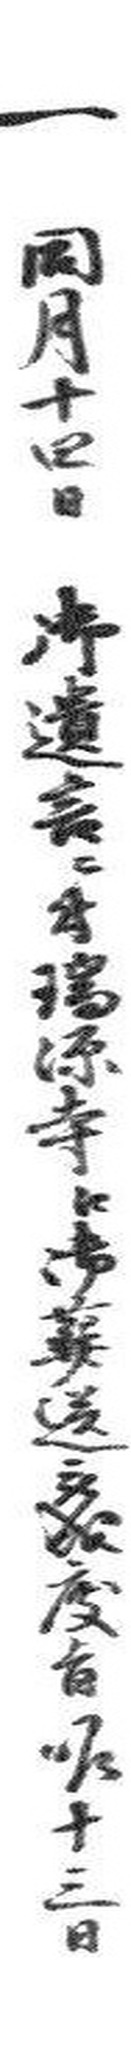一同月十四日御遺言ニ付瑞源寺江御葬送被成度旨昨
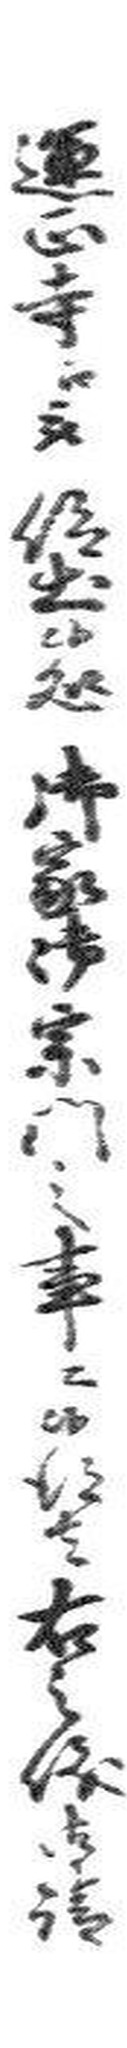運正寺江被仰出候処御家御宗門之事ニ候得者右之儀御請
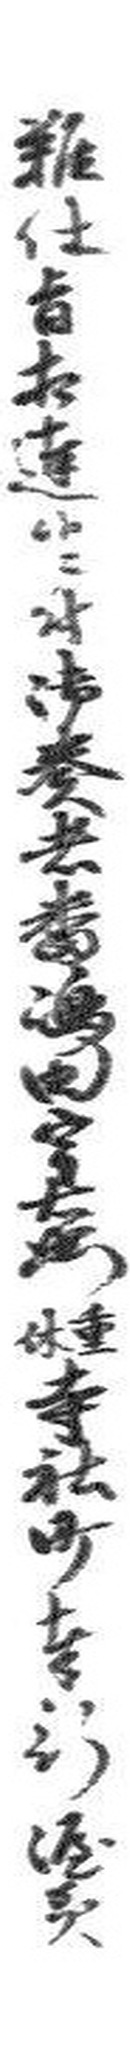難仕旨相達候ニ付御奏者番嶋田宇右衛門重休寺社町奉行渥美

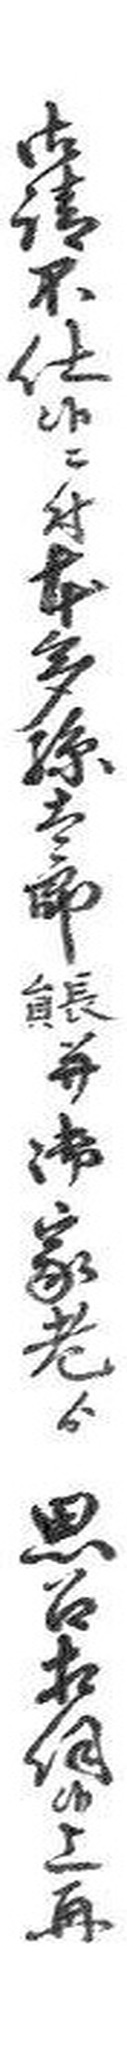御請不仕候ニ付本多孫太郎長員并御家老ゟ思召相伺候上再
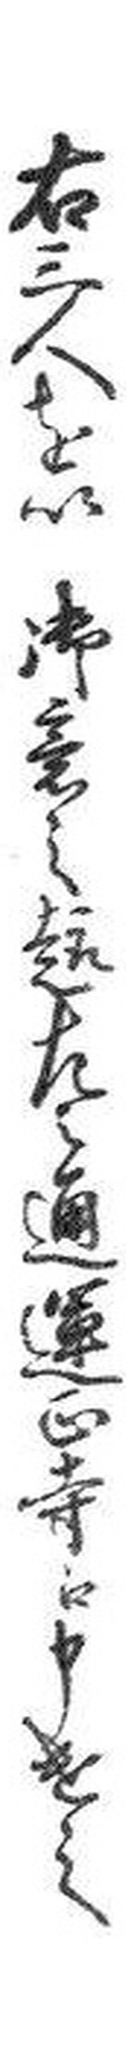右三人を以御意之趣左之通運正寺江申遣之
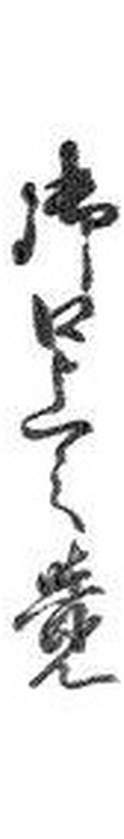御口上之覚
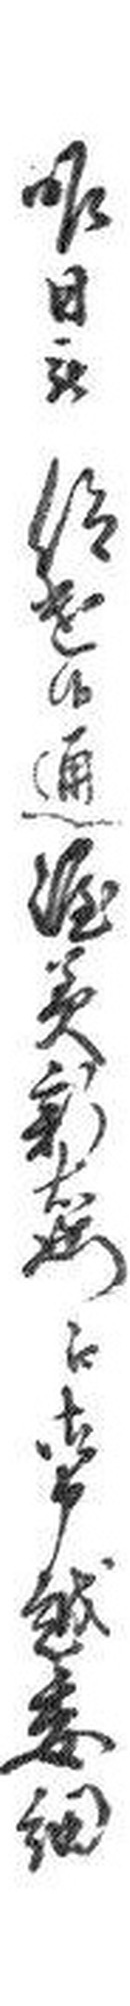昨日被仰遣候通渥美新右衛門江御申越
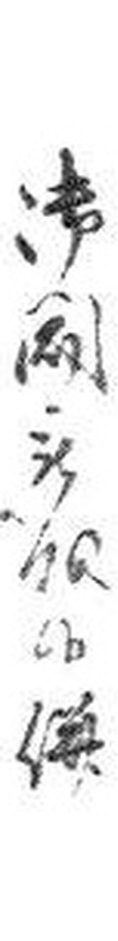御聞被成候併
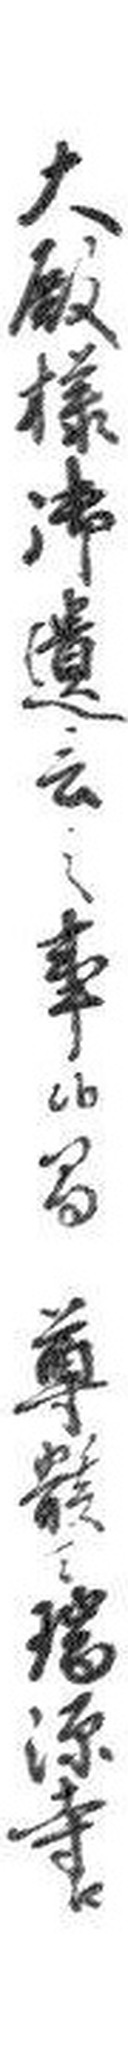大殿様御遺言之事候間尊骸者瑞源寺江
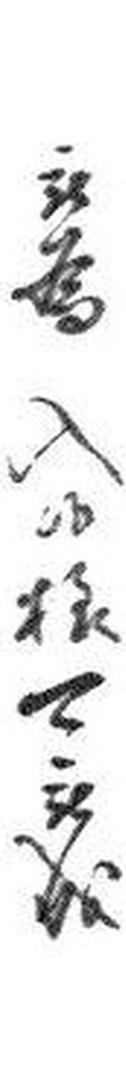被為入候様可被成
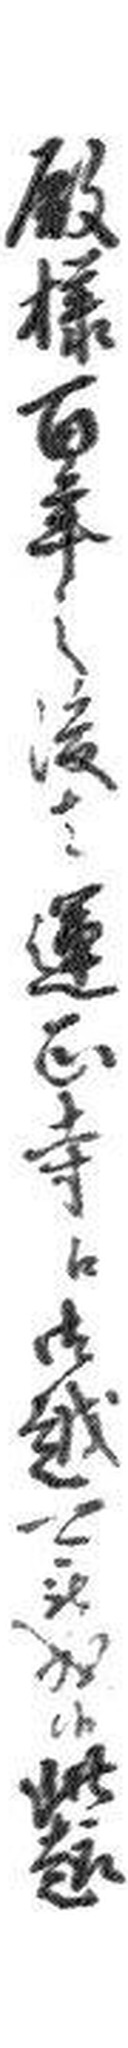殿様百年之後者運正寺江御越可被成候此趣
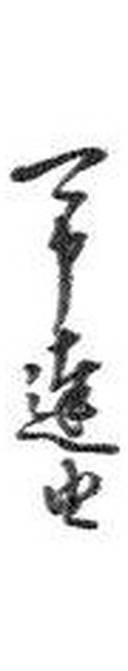可申達由
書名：家譜 二十六 吉品公 従宝永七年到正徳二年
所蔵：福井県文書館 Fukui Prefectural Archives
